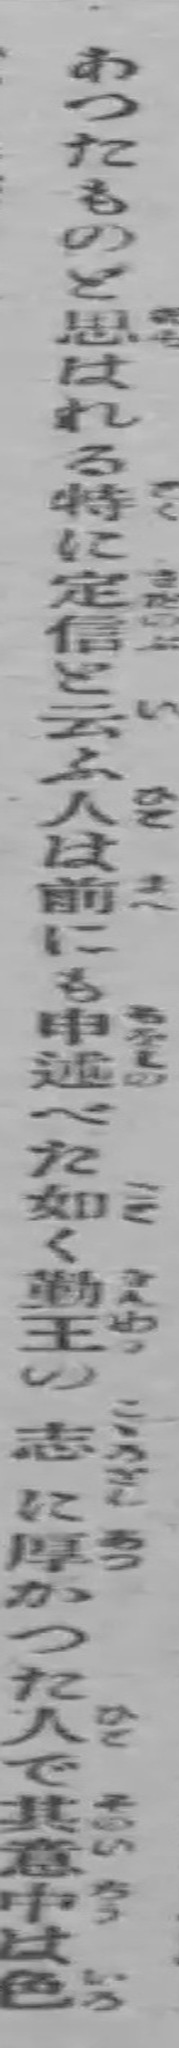あつたものと思はれる特に定信と云ふ人は前にも申述べた如く勤王の志に厚かつた人で其意中は色
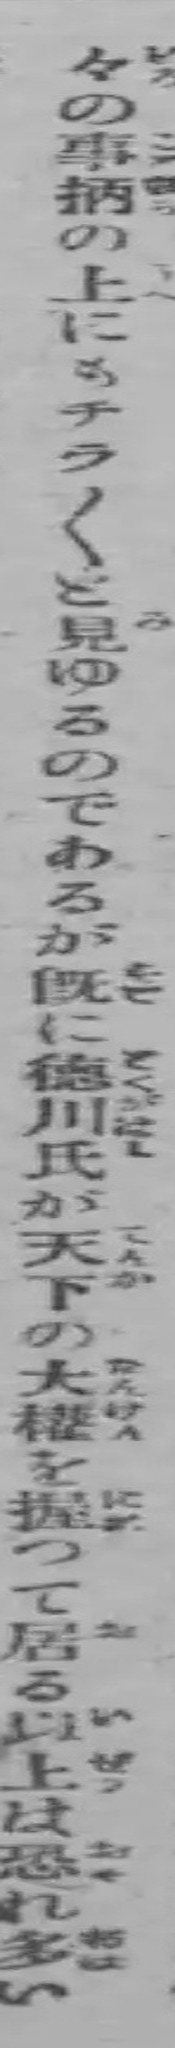色の事柄の上にもチラ〳〵と見ゆるのであるが既に徳川氏が天下の大権を握つて居る以上は恐れ多い
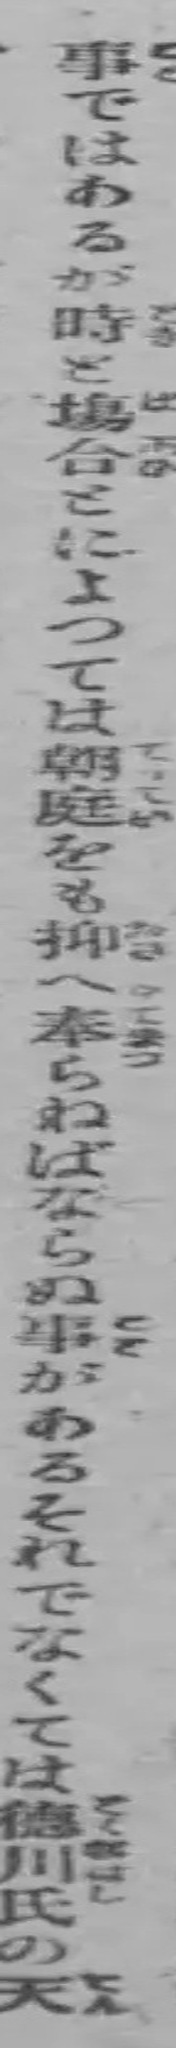事ではあるが時と場合とによつては朝庭をも抑へ奉らねばならぬ事があるそれでなくては徳川氏の天
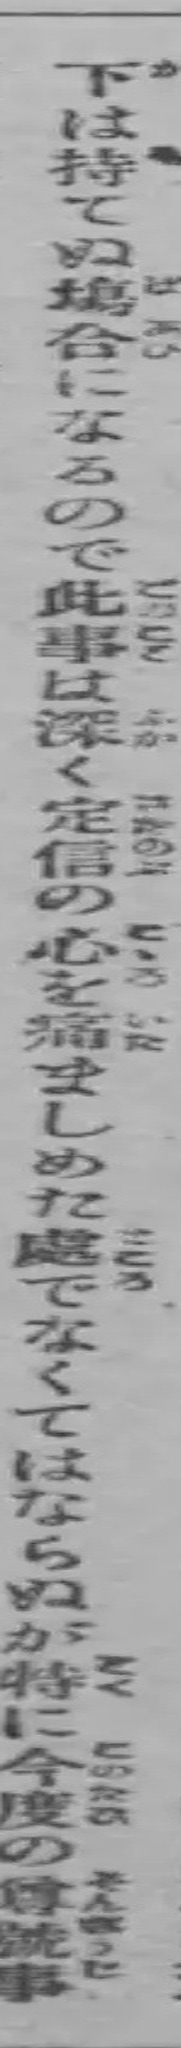下は持てぬ場合になるので此事は深く定信の心を痛ましめた処でなくてはならぬが特に今度の尊号事
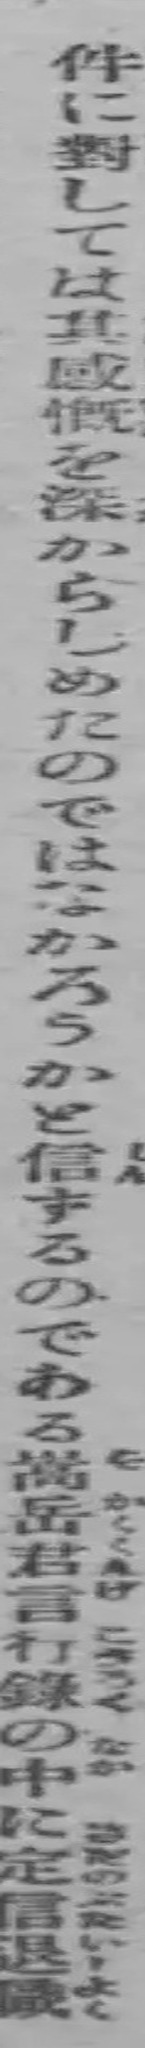件に対しては其感慨を深からしめたのではなかろうかと信ずるのである嵩岳君言行録の中に定信退職
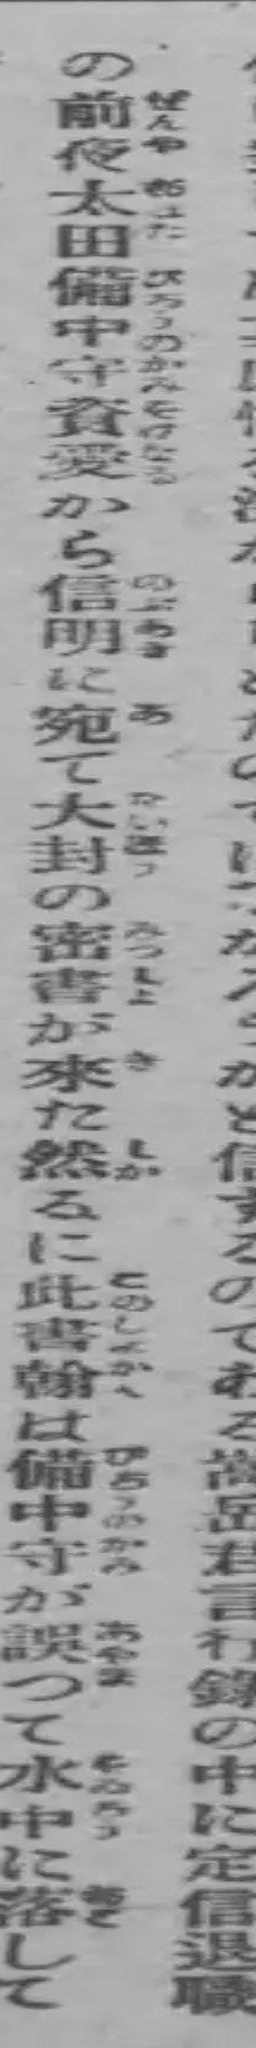の前夜太田備中守資愛から信明に宛て大封の密書が来た然るに此書翰は備中守が誤つて水中に落して
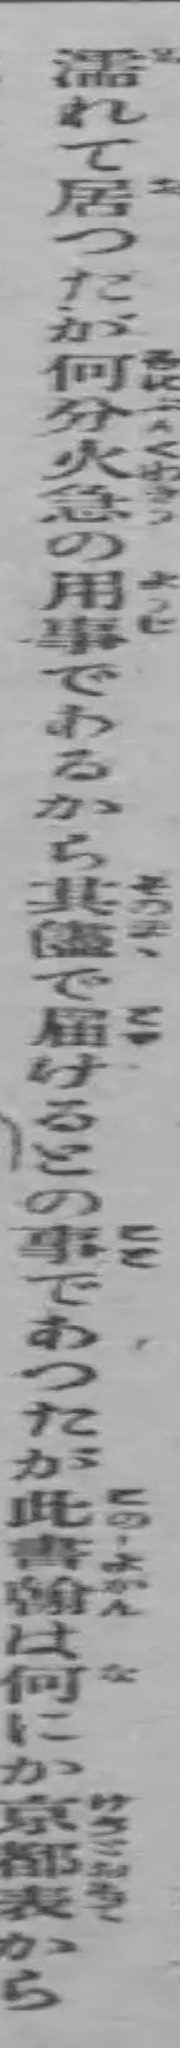濡れて居つたが何分火急の用事であるから其儘で届けるとの事であつたが此書翰は何にか京都表から
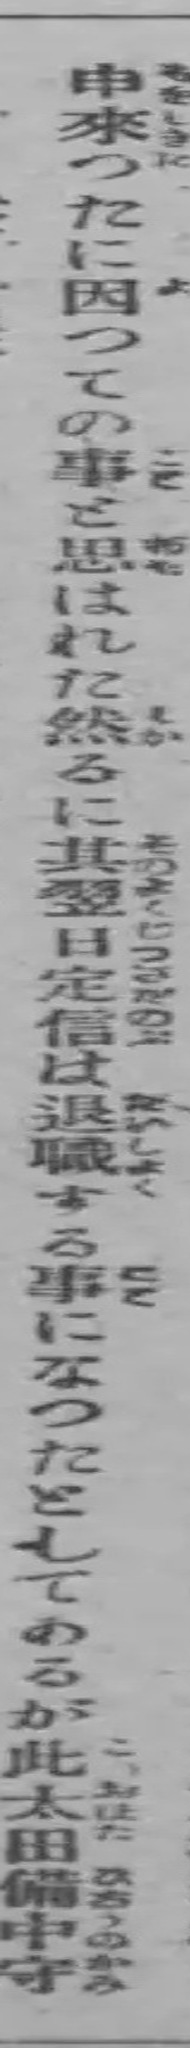申来つたに因つての事と思はれた然るに其翌日定信は退職する事になつたとしてあるが此太田備中守
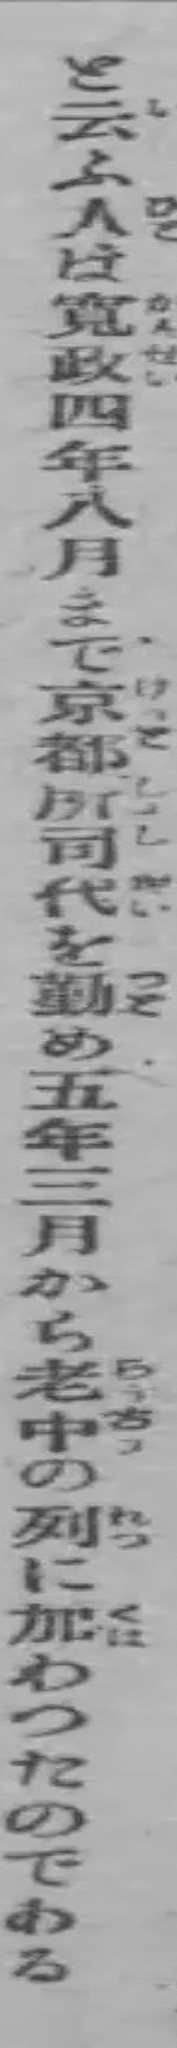と云ふ人は寛政四年八月まで京都所司代を勤め五年三月から老中の列に加わつたのである
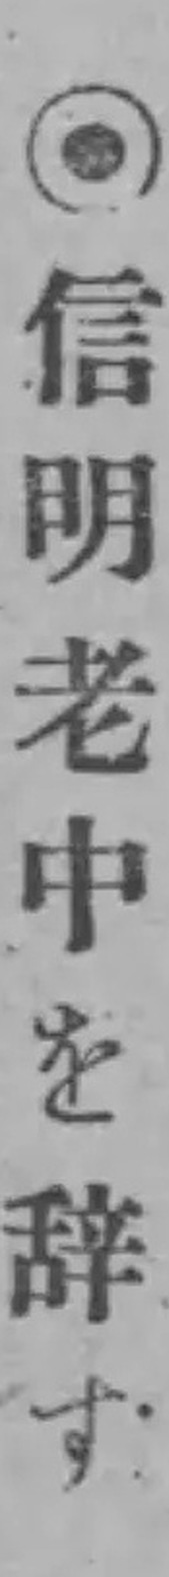⦿信明老中を辞す
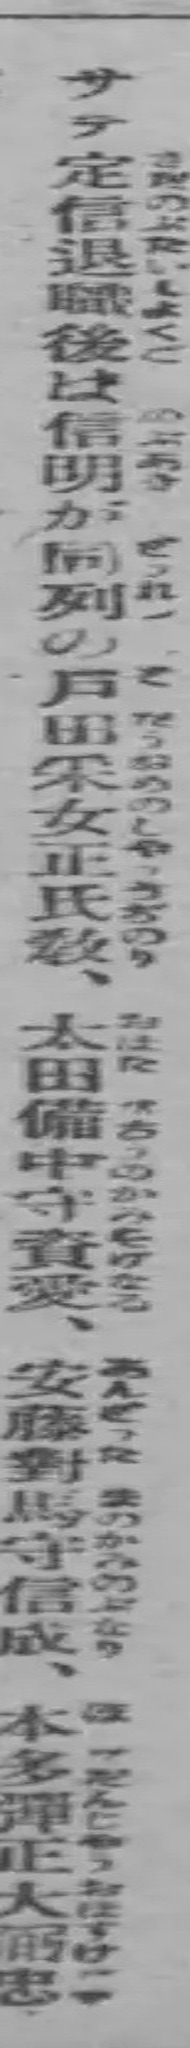サテ定信退職は信明が同列の戸田采女正氏教、太田備中守資愛、安藤対馬守信成、本多弾正大弼忠
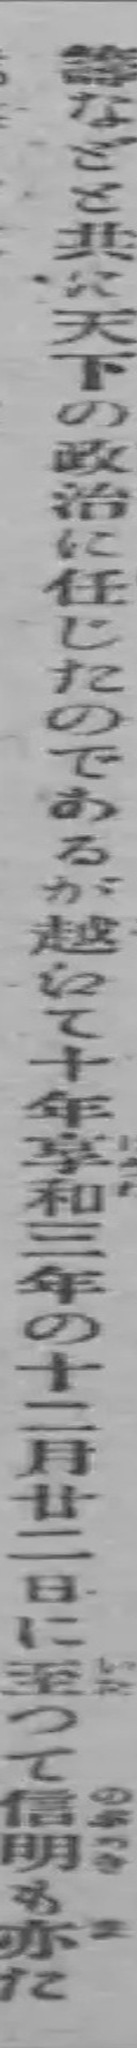信明の退職数などと共に天下の政治に任じたのであるが越えて十年享和三年の十二月廿二日に至つて信明も亦た
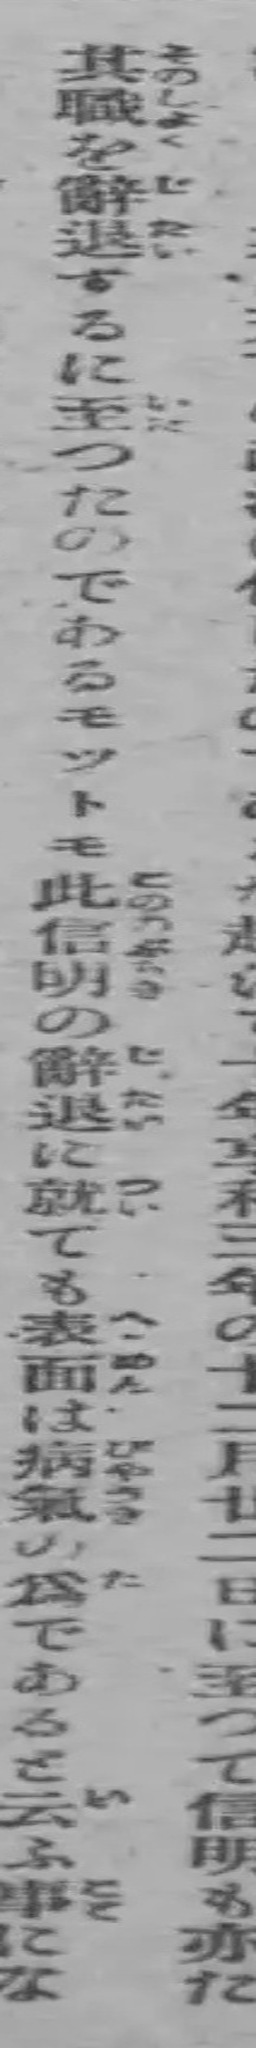其職を辞退するに至つたのであるモツトモ此信明の辞退に就ても表面は病気の為であると云ふ事にな
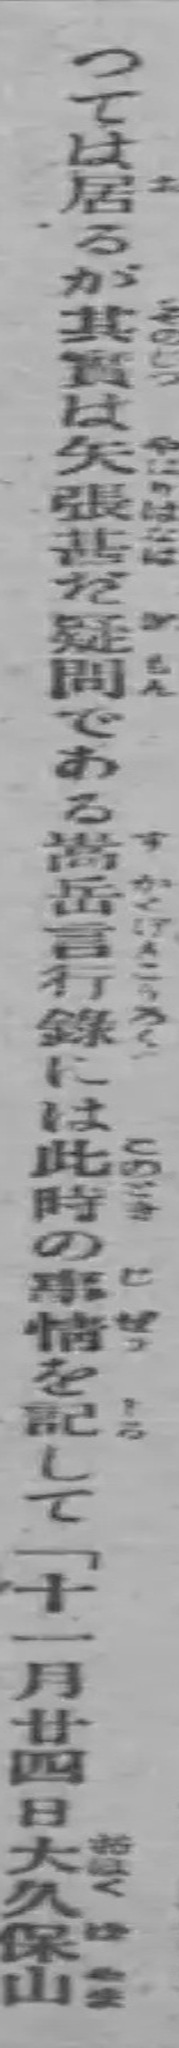つては居るが其実は矢張甚だ疑問である嵩岳言行録には此時の事情を記して「十一月廿四日大久保山
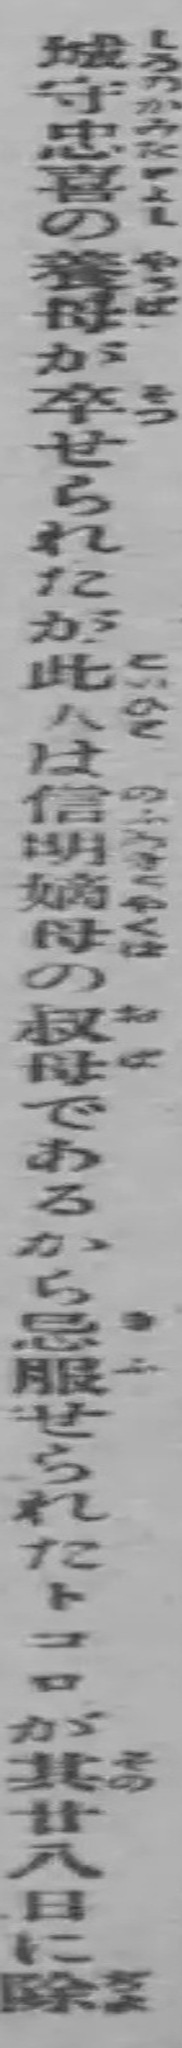城守忠喜の養母が卒せられたが此人は信明嫡母の叔母であるから忌服せられたトコロが其廿八日に除
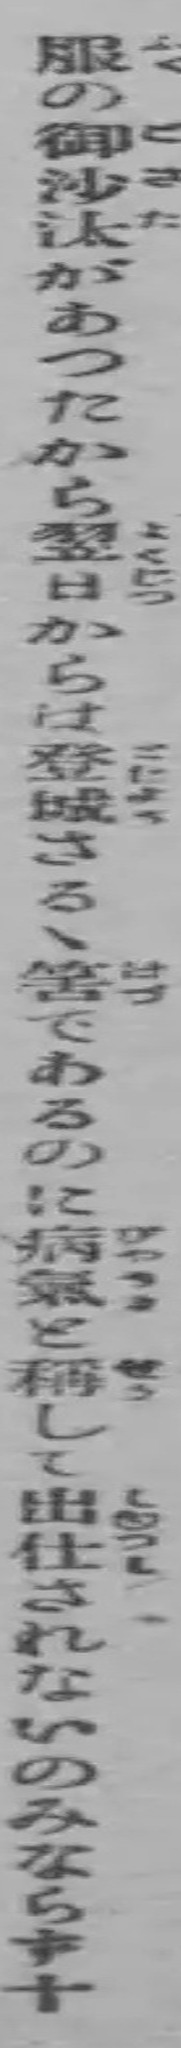服の御沙汰があつたから翌日からは登城さるゝ筈であるのに病気と称して出仕されないのみならず十
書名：豊橋市史談
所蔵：国立国会図書館 National Diet Library, JAPAN
